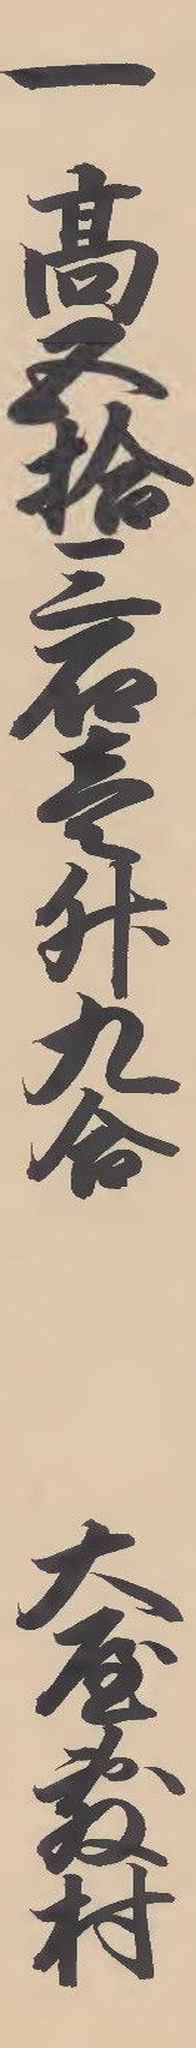一高五拾三石壱升九合大屋敷村
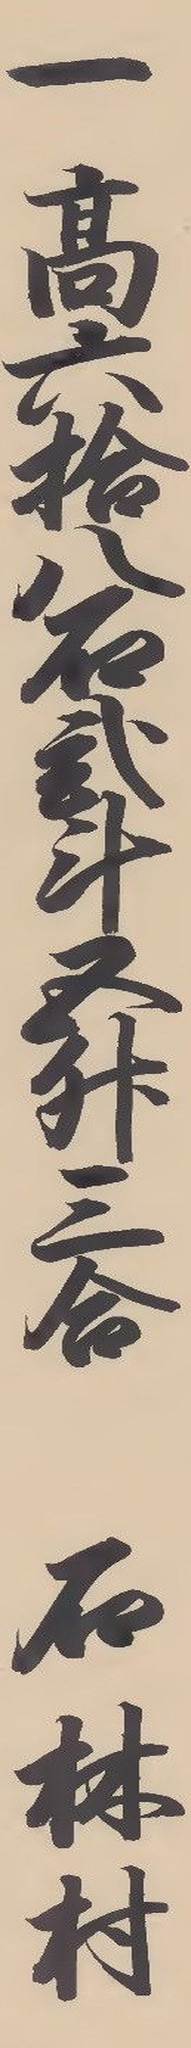一高六拾八石弐斗五升三合石林村
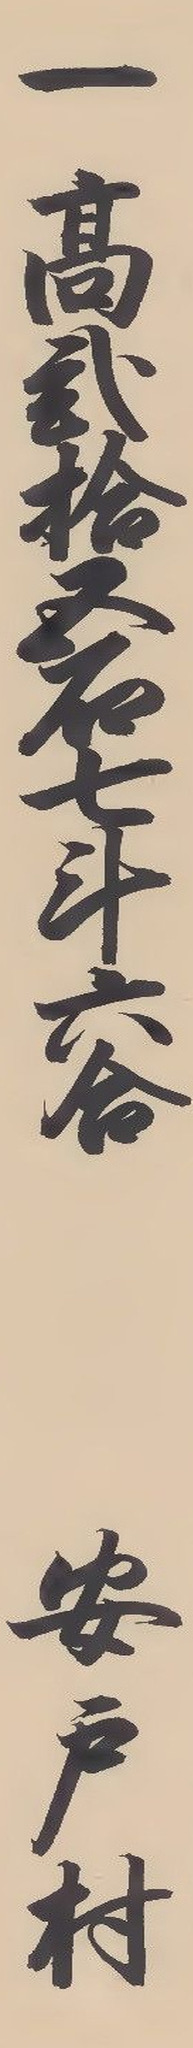一高弐拾五石七斗六合安戸村
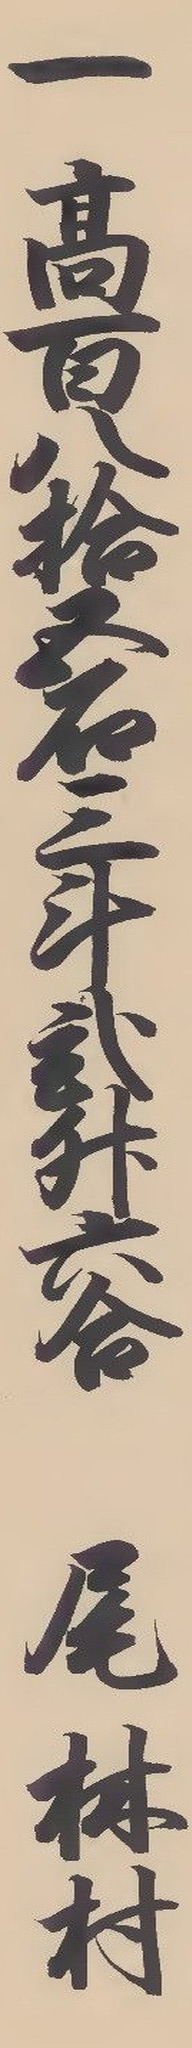一高百八拾五石三斗弐升六合尾林村

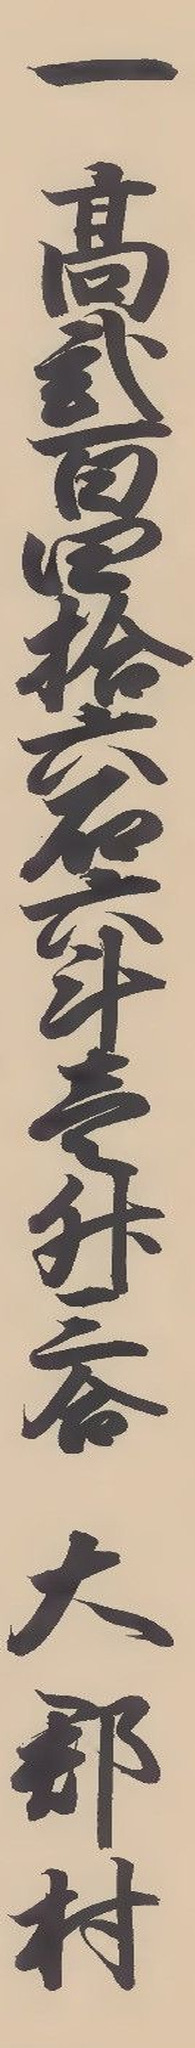一高弐百四拾六石六斗壱升三合大郡村
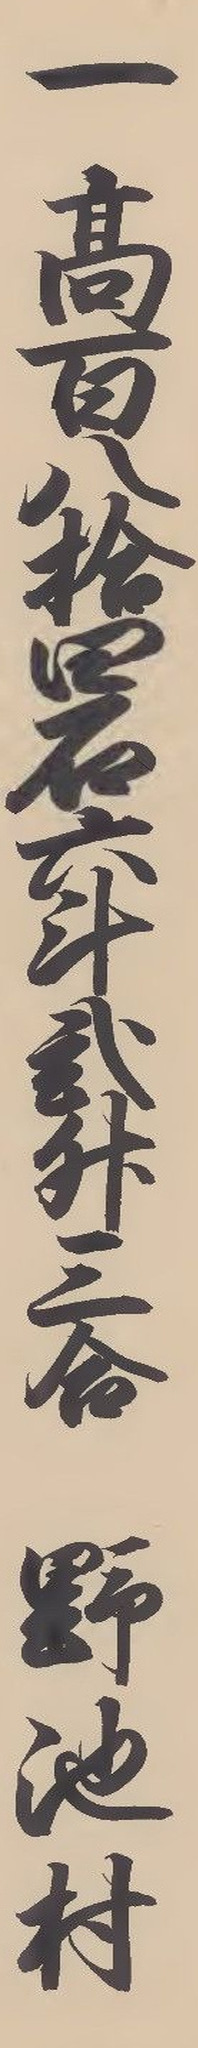一高百八拾四石六斗弐升三合野池村
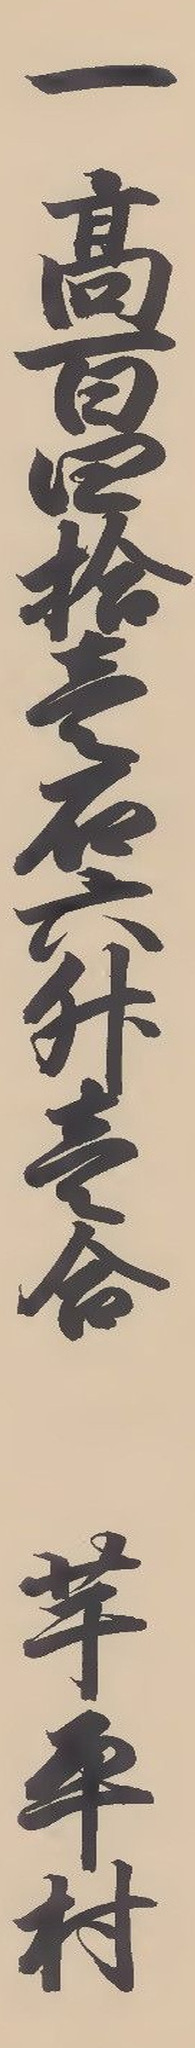一高百四拾壱石六升壱合芋平村
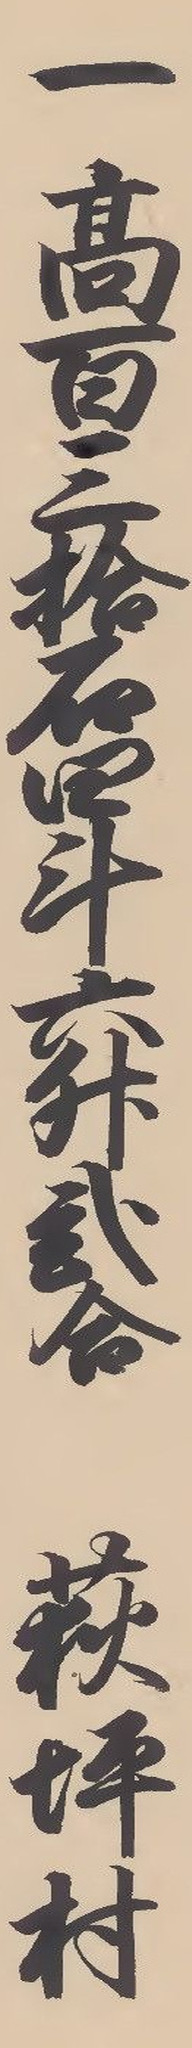一高百三拾石四斗六升弐合荻坪村
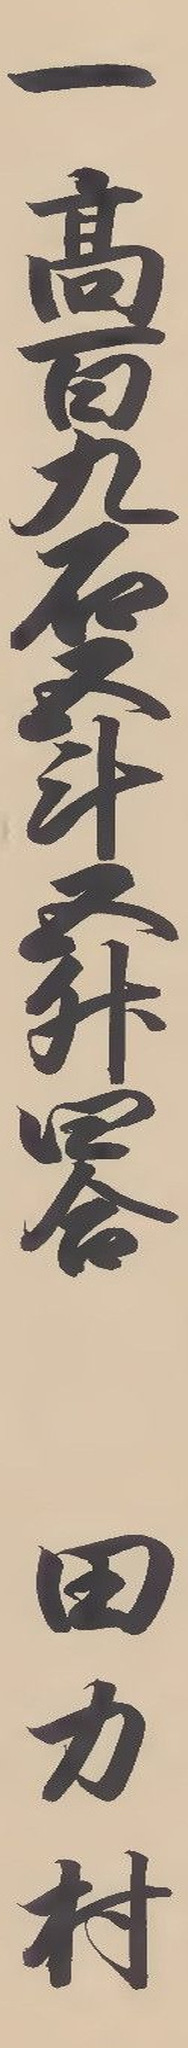一高百九石五斗五升四合田力村
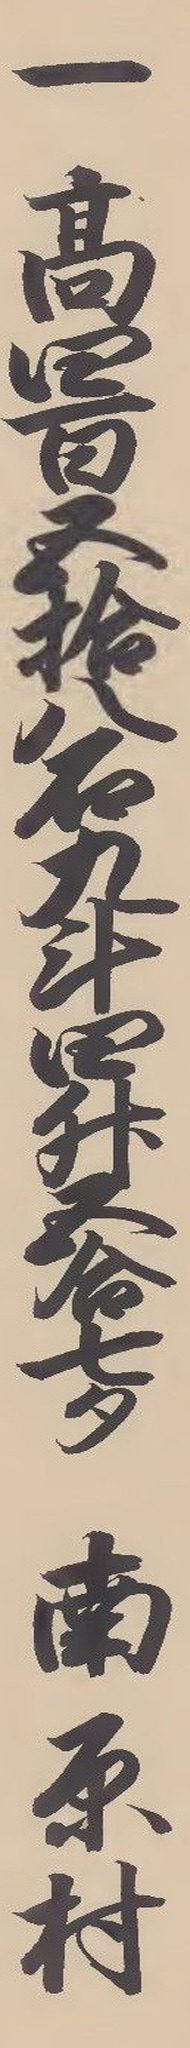一高四百五拾八石九斗四升五合七勺南原村

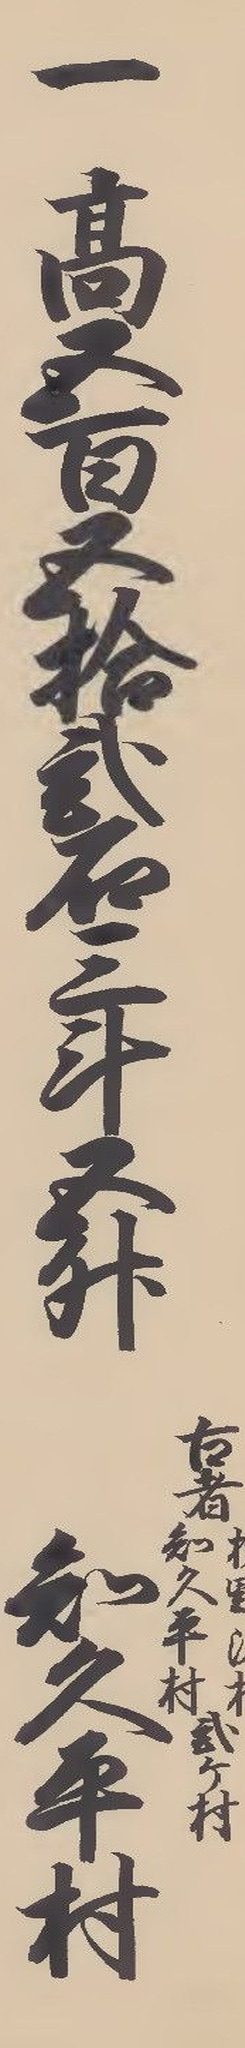一高五百五拾弐石三斗五升知久平村
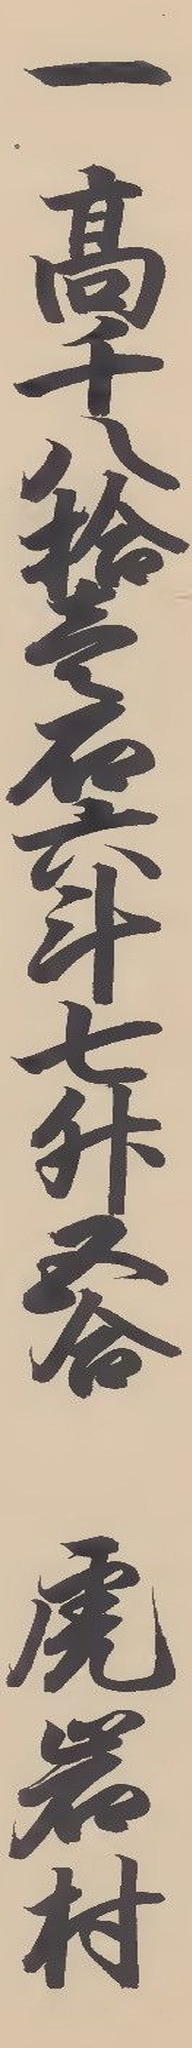一高千八拾壱石六斗七升五合虎岩村
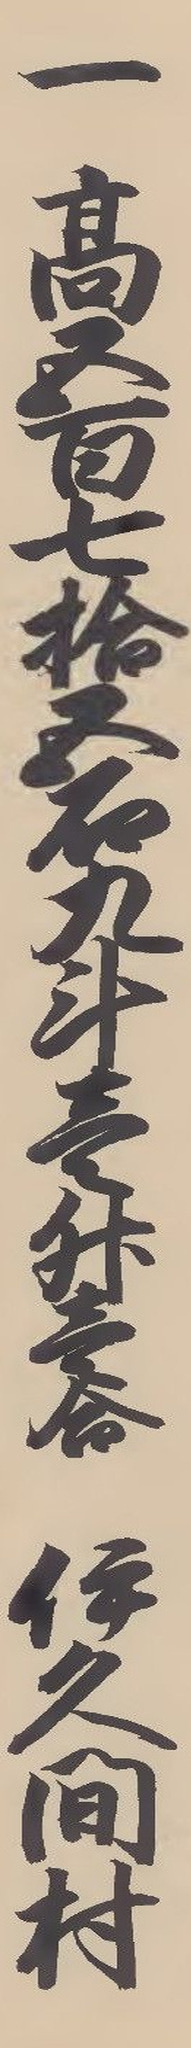一高五百七拾五石九斗壱升壱合伊久間村
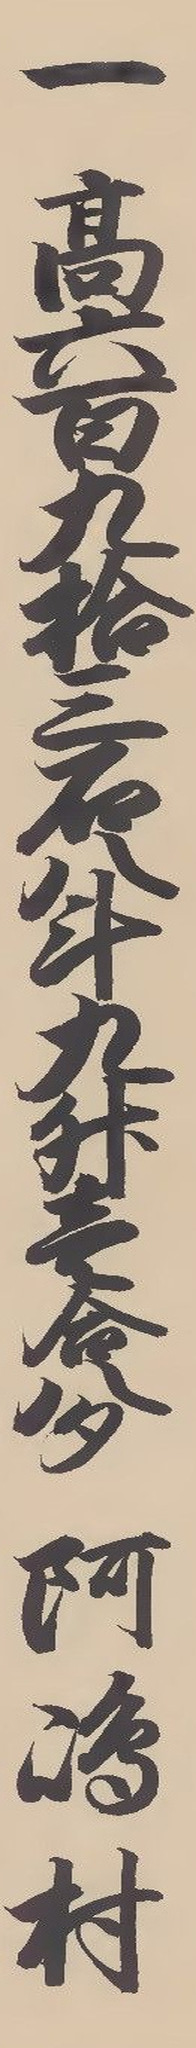一高六百九拾三石八斗九升壱合八勺阿島村
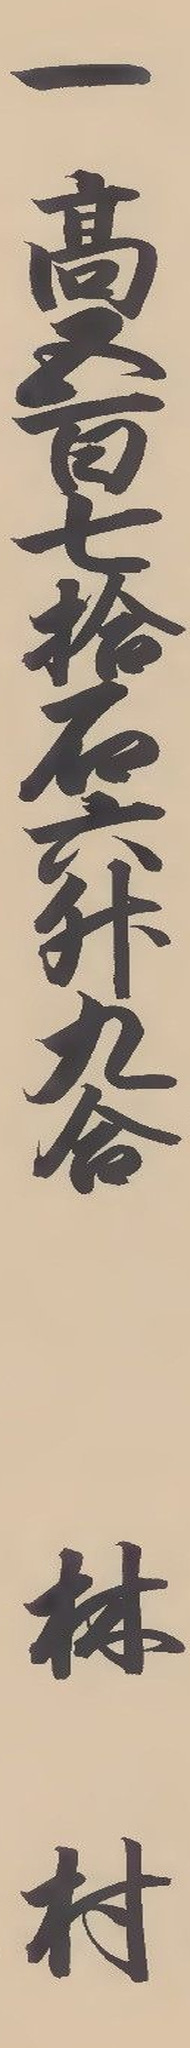一高五百七拾石六升九合林村
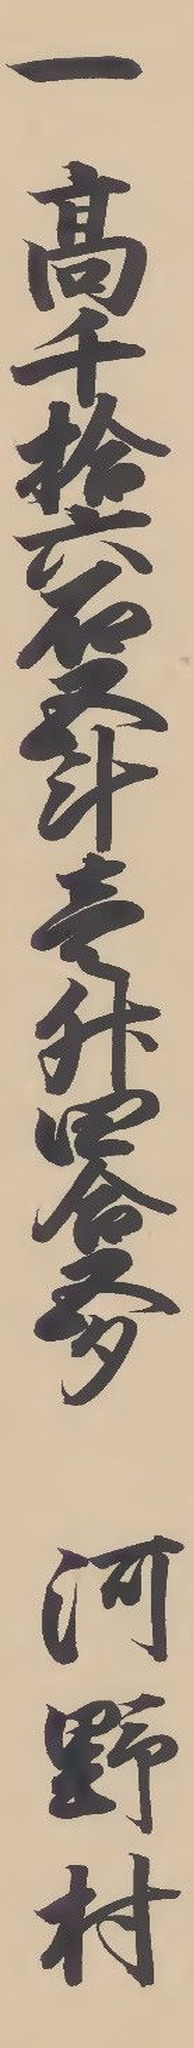一高千拾六石五斗壱升四合五勺河野村
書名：信濃国郷帳
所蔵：国立公文書館 National Archives of Japan
